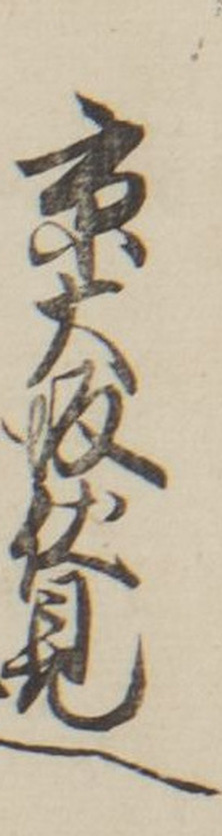京大坂伏見
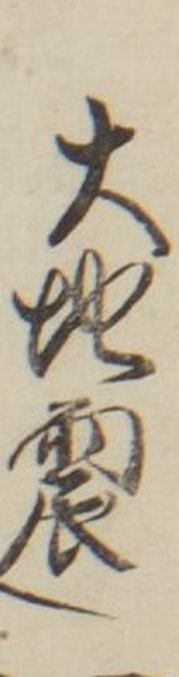大地震
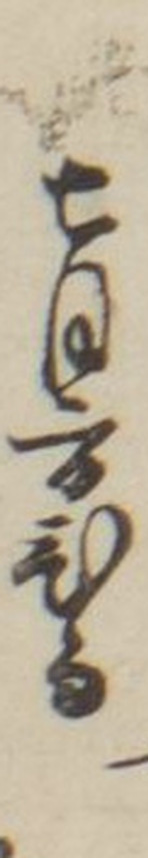七月二日ひる
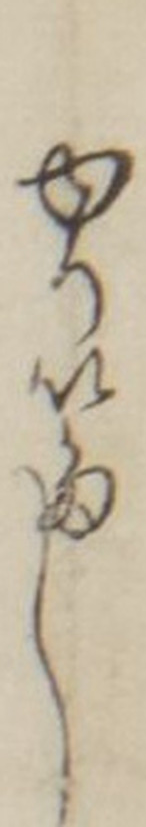ゆりいたし
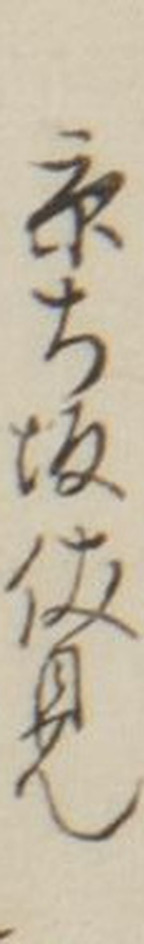京大坂伏見
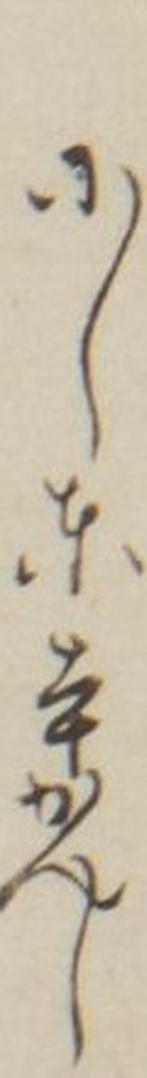にし東本かんし
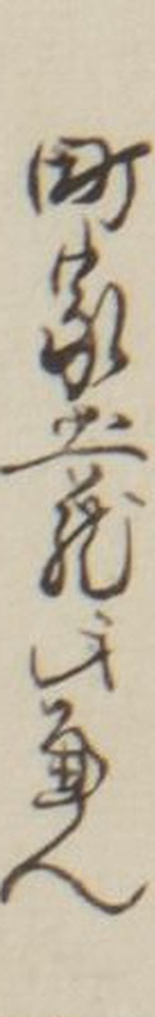町家土蔵に此へん
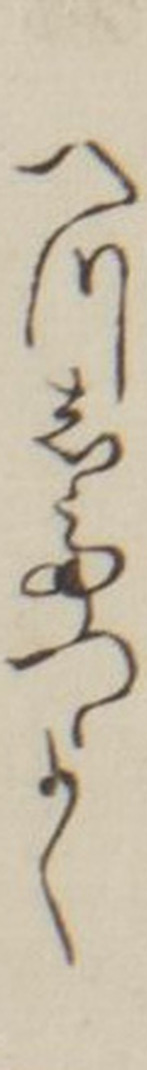へつしてつよく
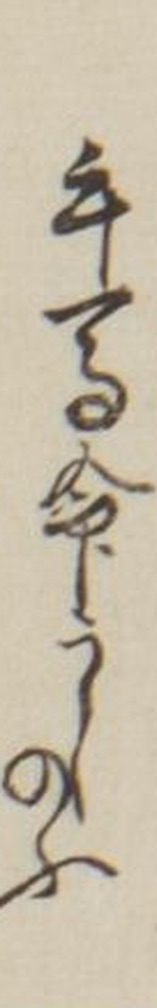牛馬命うしのふ
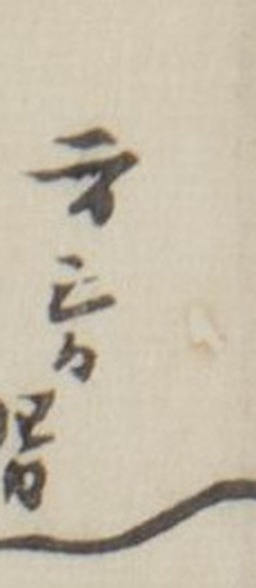二日三日四日
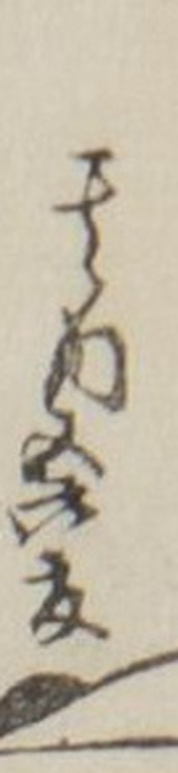其内五六度
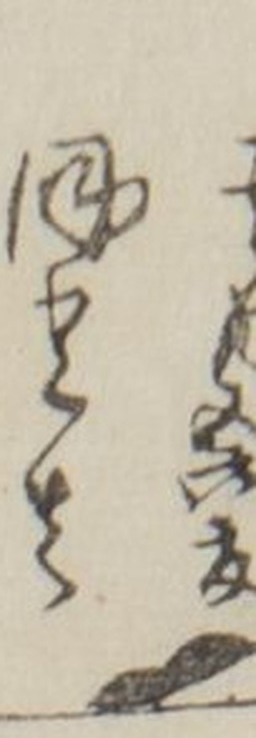ほとは
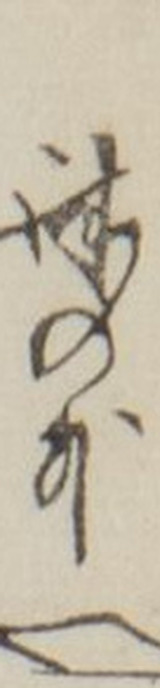殊の外
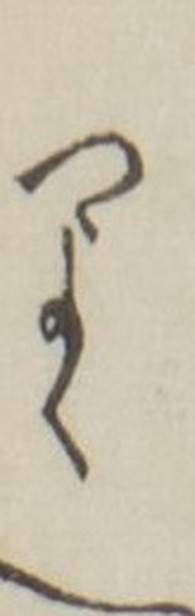つよく
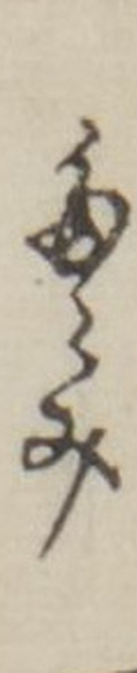たゝみ
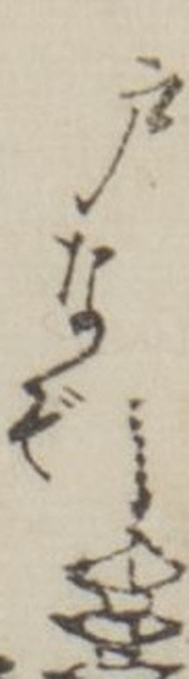戸なぞ
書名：京大坂伏見大地震
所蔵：あいおいニッセイ同和損保株式会社
